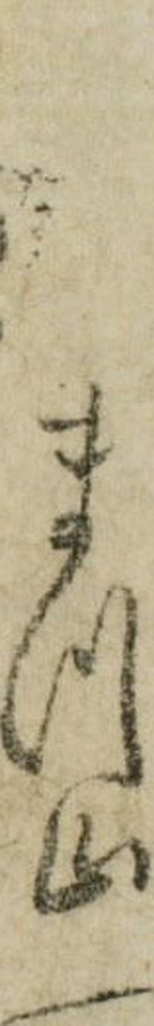まつ山
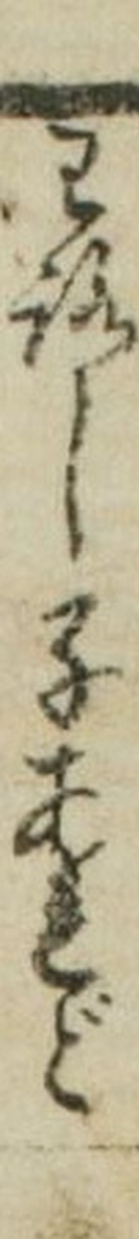わろし子あれど
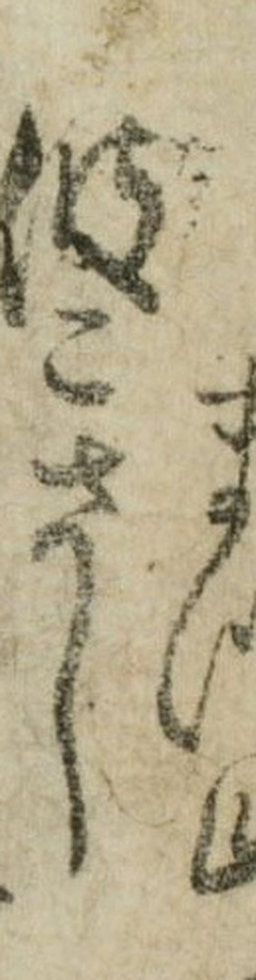波こさし
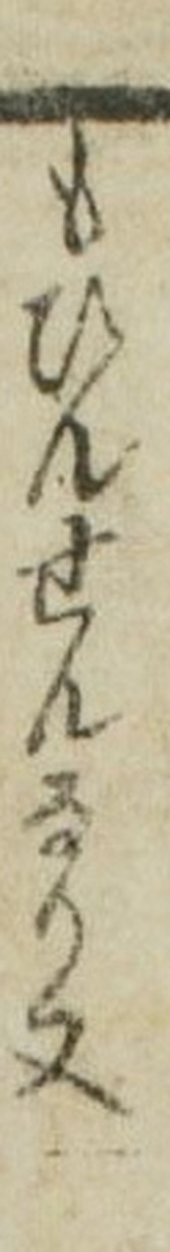もひんせんなり又
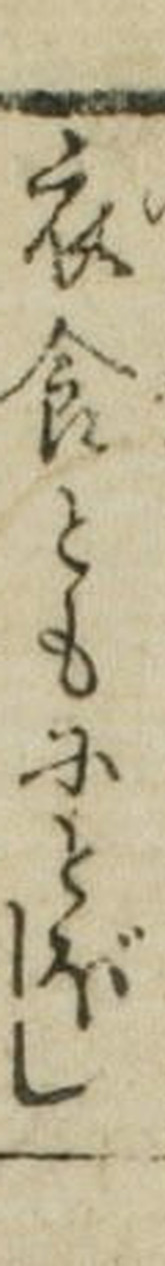衣食ともにとぼし
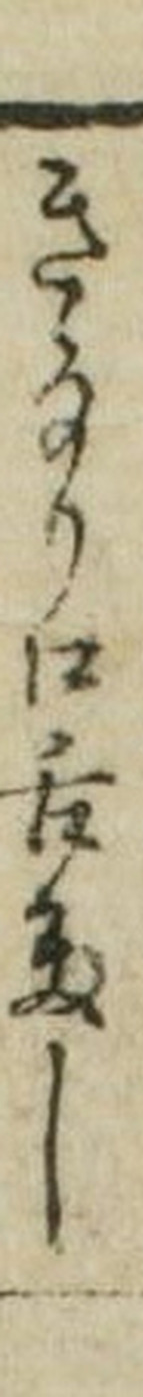きなり口舌多し
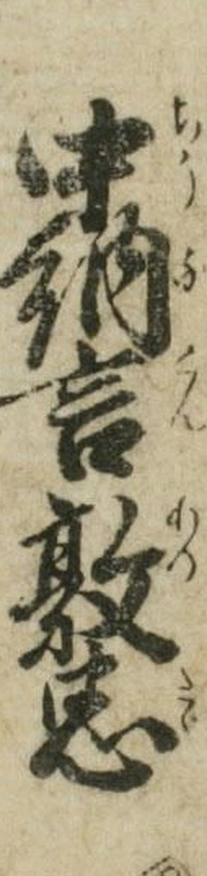中納言敦忠
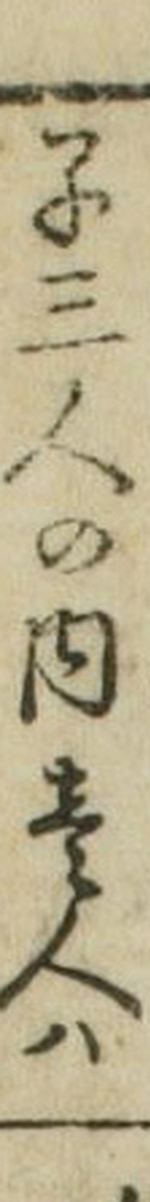子三人の内壱人は
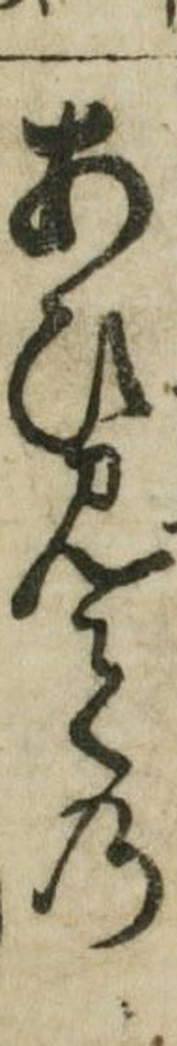あひみての
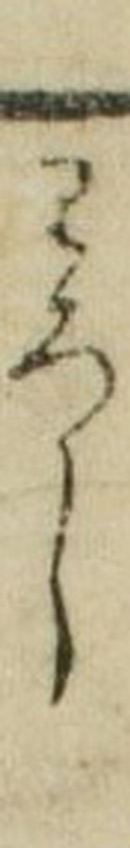わろし
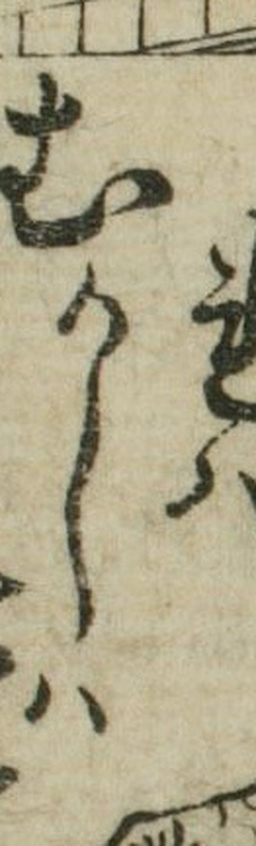むかしは
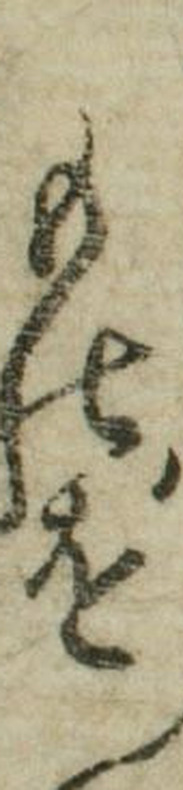ものを
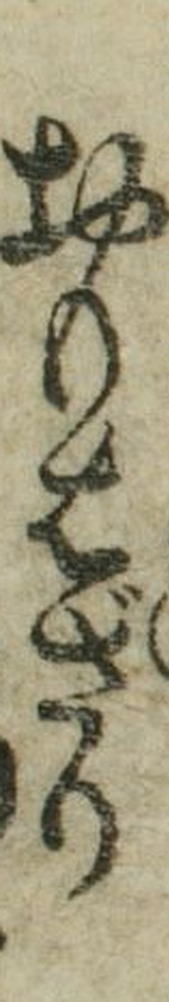おもはざり

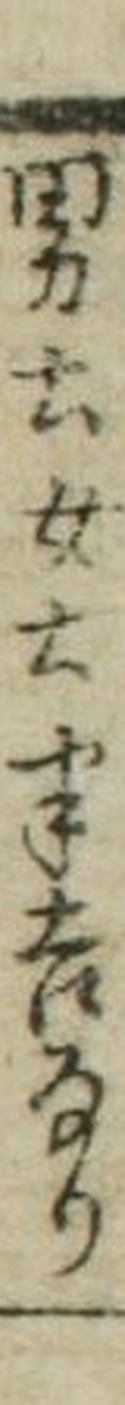男土女土半吉なり
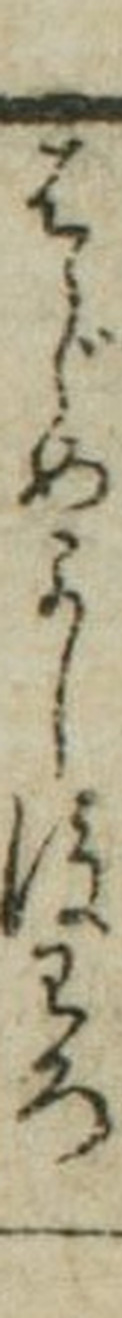はじめよし後わろし
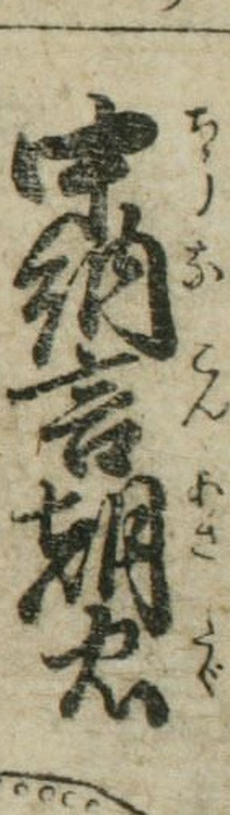中納言朝忠
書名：百人一首
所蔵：東京学芸大学教育コンテンツアーカイブ
